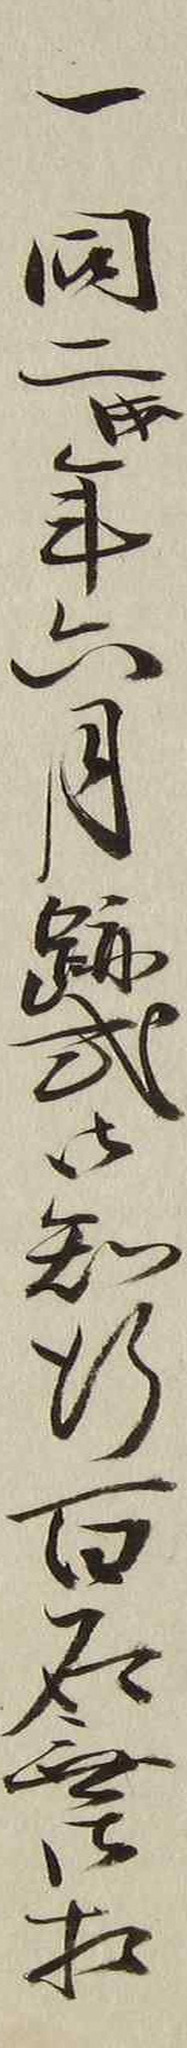一同二戌年六月跡式御知行百石無御相
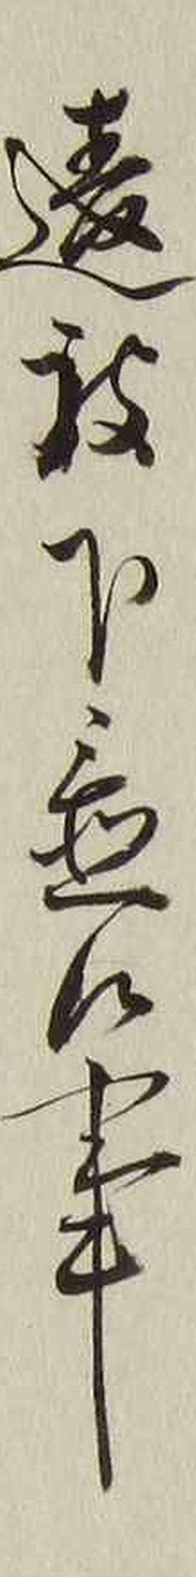被下置候事
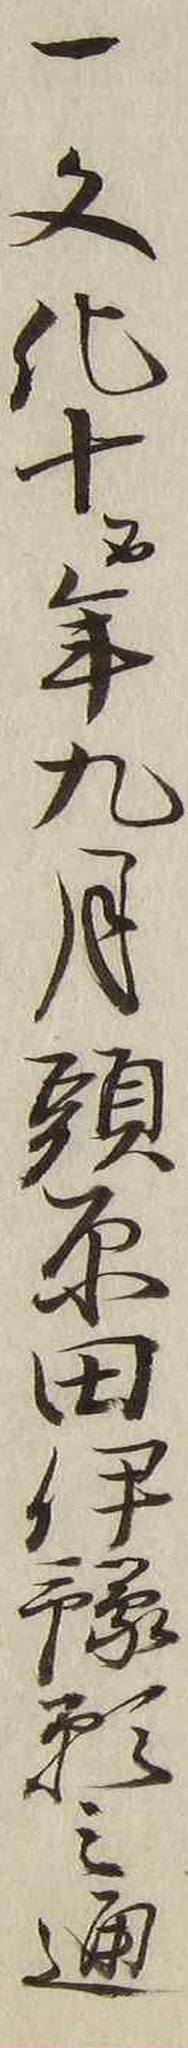一文化十酉年九月頭原田伊予願之通
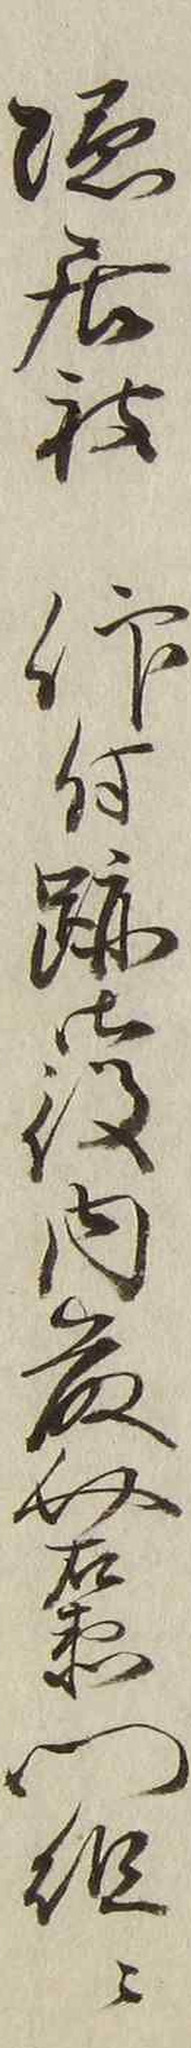隠居被仰付跡御役内藤介右衛門組に

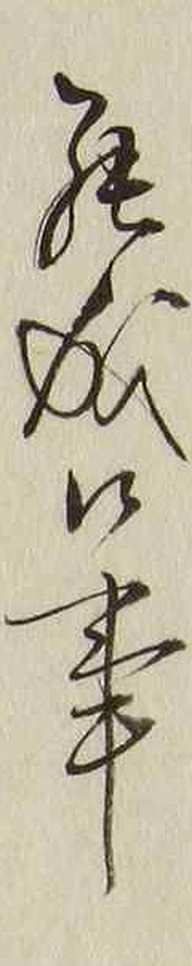罷成候事
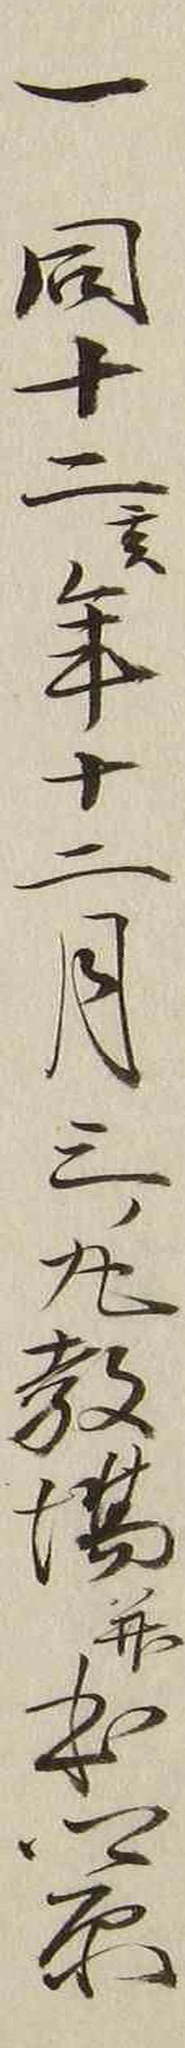一同十二亥年十二月三ノ丸教場并本郷原
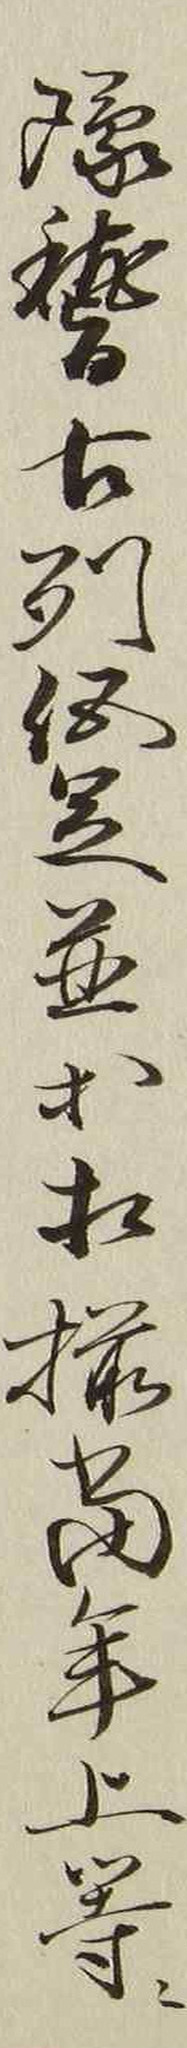隊稽古列伍足並等相揃当年上等に
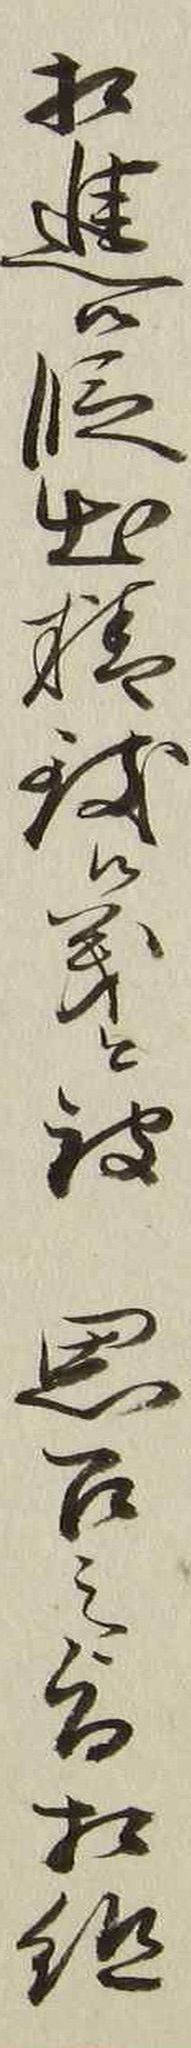相進候段出精致候義と被思召之旨相組
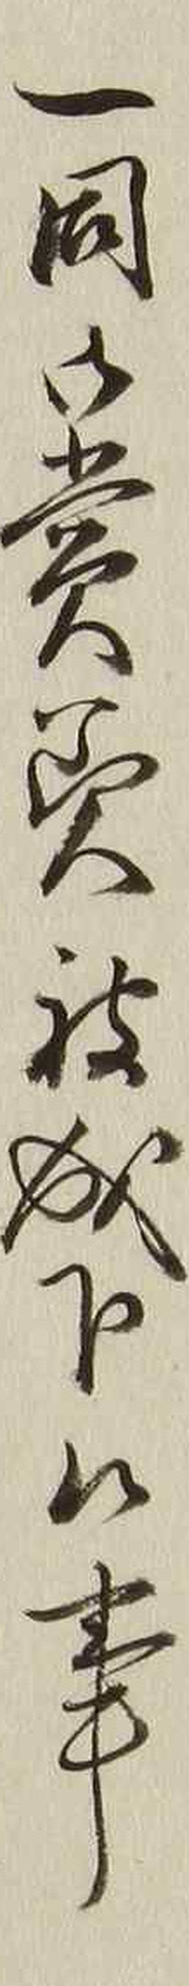一同御賞美被成下候事
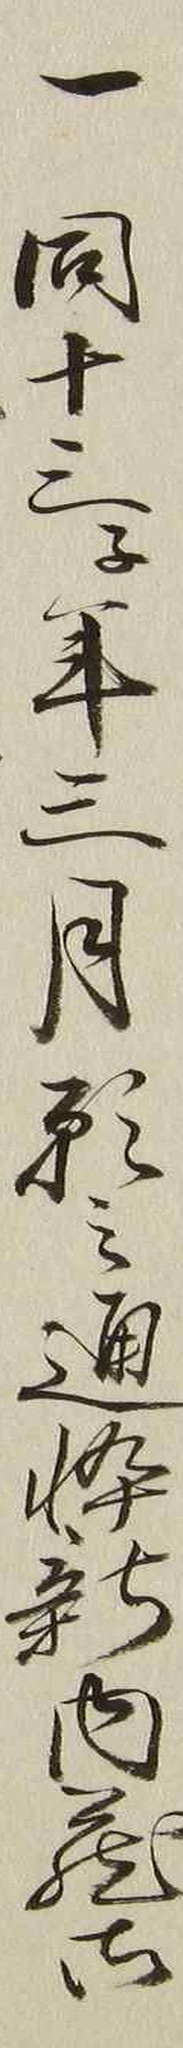一同十三子年三月願之通倅新内蔵御
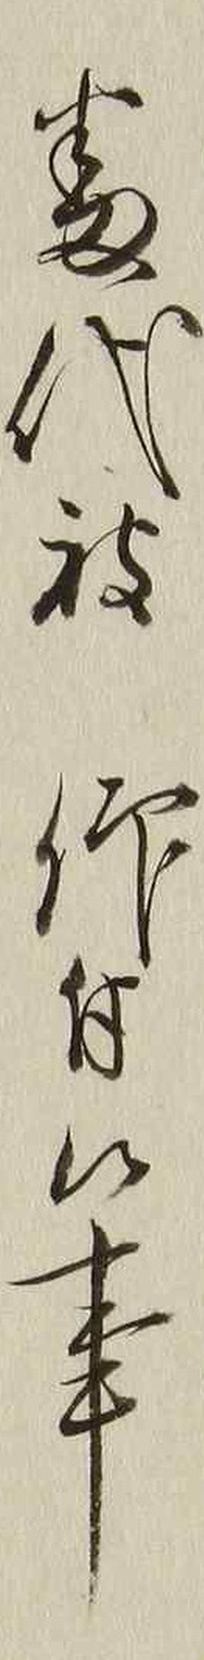番代被仰付候事
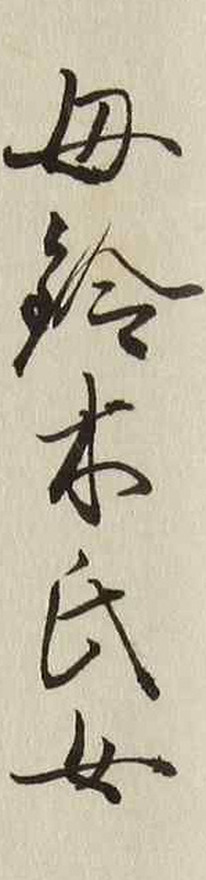母鈴木氏女
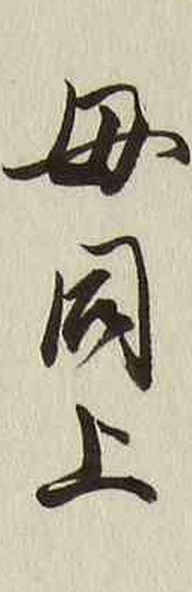母同上
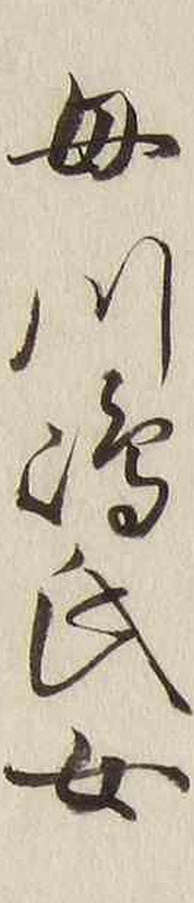母川嶋氏女

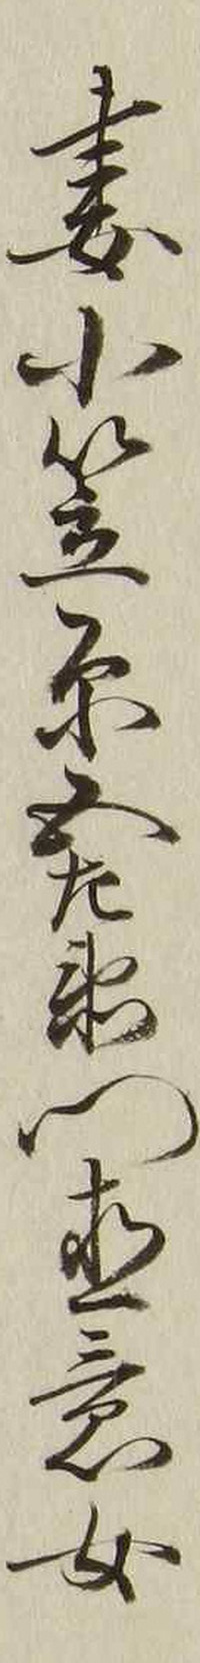妻小笠原五左衛門直意女
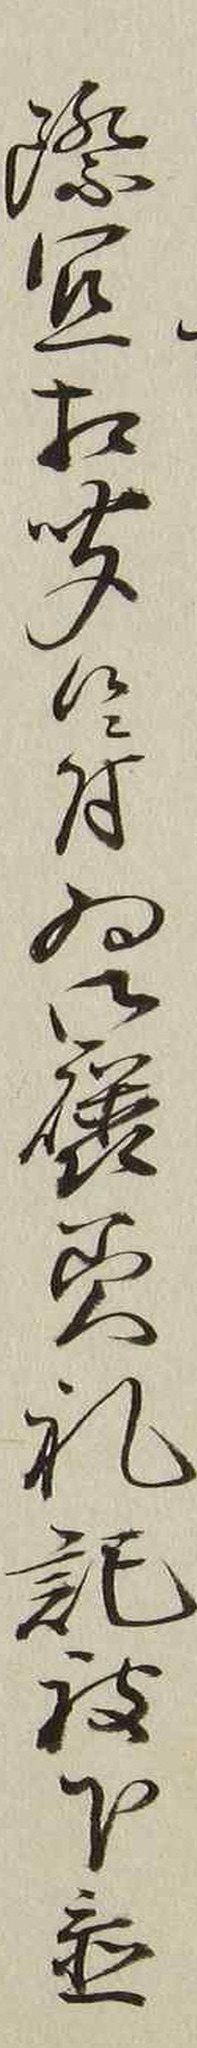際宜相聞候に付為御褒美礼記被下置
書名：諸士系譜　巻之157　ね之部1
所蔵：会津若松市立会津図書館
